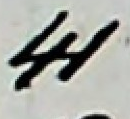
41
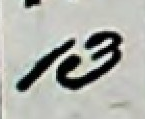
13
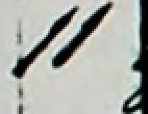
11
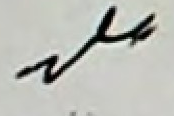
do
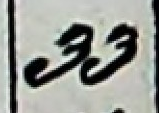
33
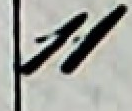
11
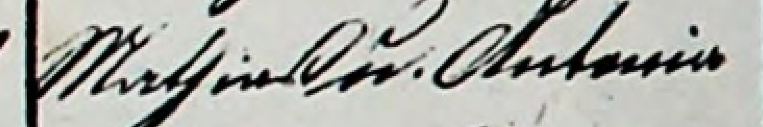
Mathias u. Antonia
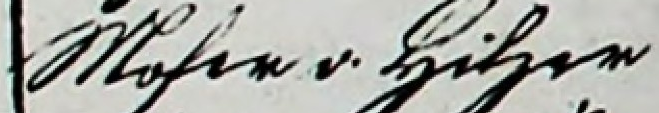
Moser v. Hilzer
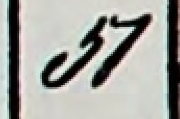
51
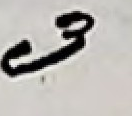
3
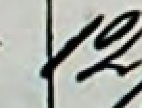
12
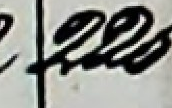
225
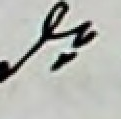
do
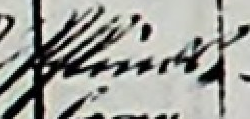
Pflinds„
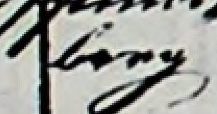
berg
